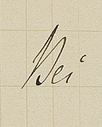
Bei
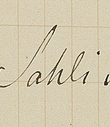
Anlass
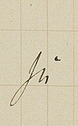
Sie
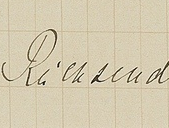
die finanziellen
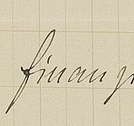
Folgen
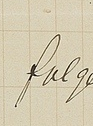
der
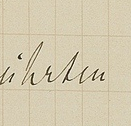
einigen
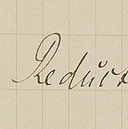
der im
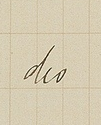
Bern
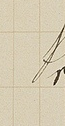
10.
